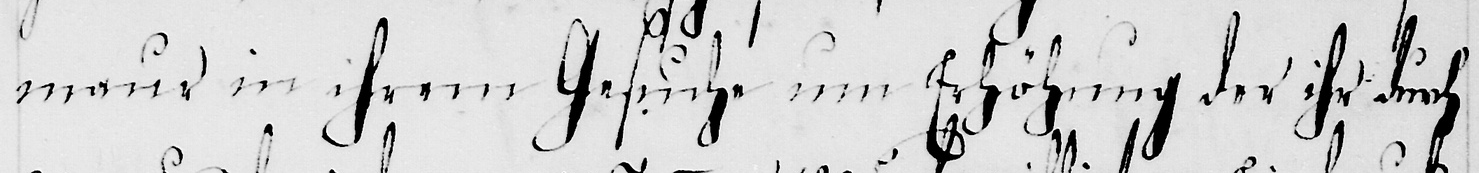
inmaur in ihrem Gesuche um Erhöhung der ihr durch
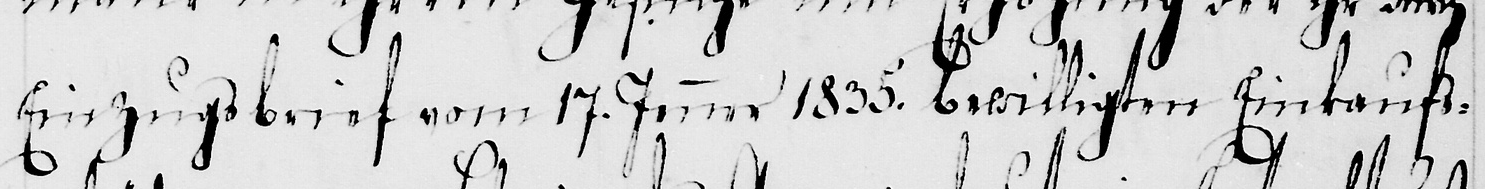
Einzugsbrief vom 17. Jenner 1835. bewilligten Einkaufs¬
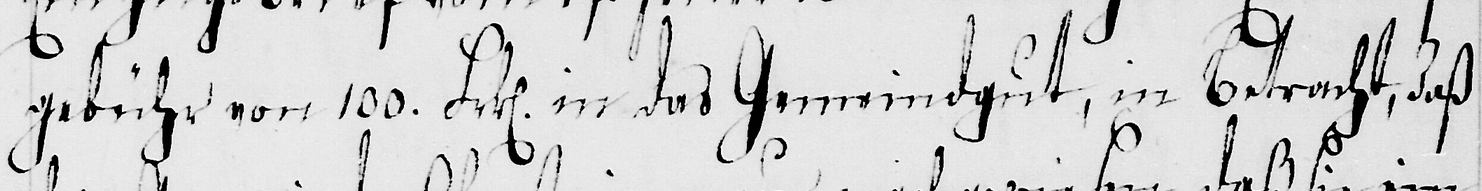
gebühr von 100. Frk[en] in das Gemeindgut, in Betracht, daß
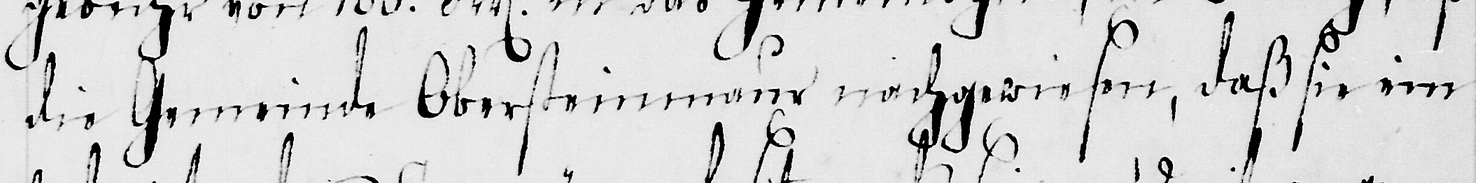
die Gemeinde Obersteinmaur nachgewiesen, daß sie ein
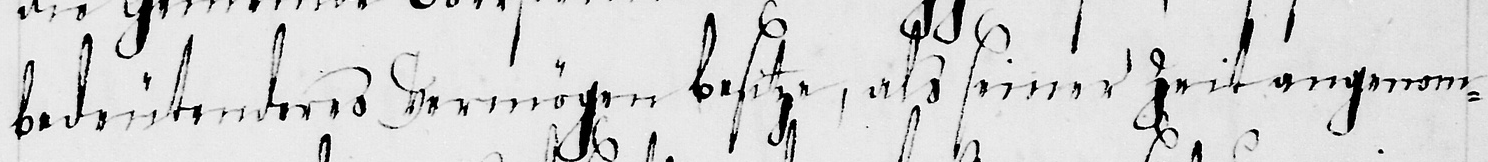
bedeutenderes Vermögen besitze, als seiner Zeit angenom¬
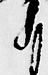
der
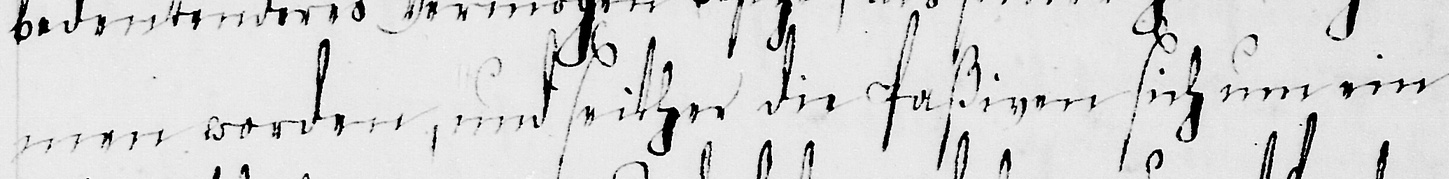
men worden, und seither die Paßiven sich um ein
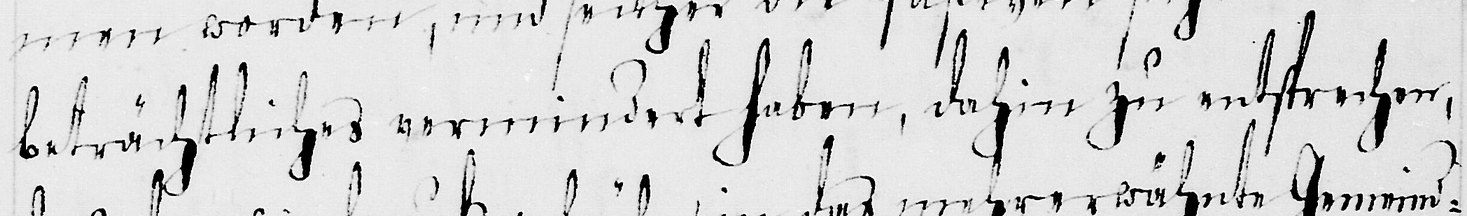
beträchtliches vermindert haben, dahin zu entsprechen,
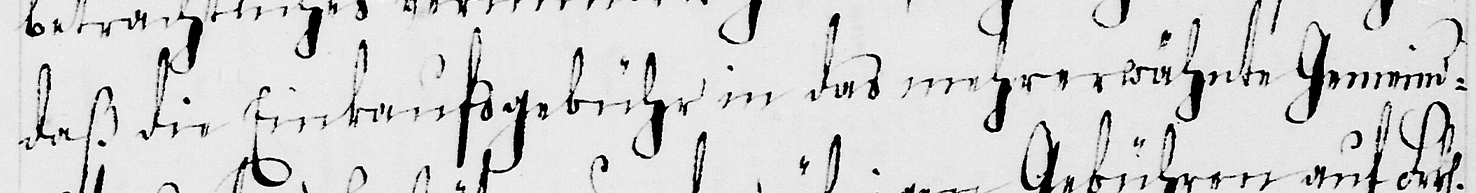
daß die Einkaufsgebühr in das mehrerwähnte Gemeind¬
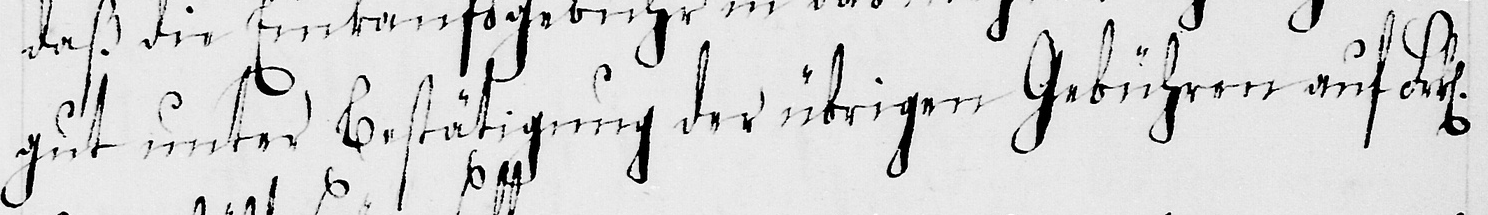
gut unter Bestätigung der übrigen Gebühren auf Fr¬
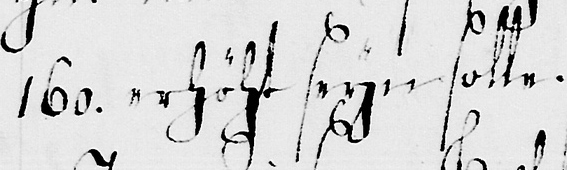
160. erhöht seyn soll¬
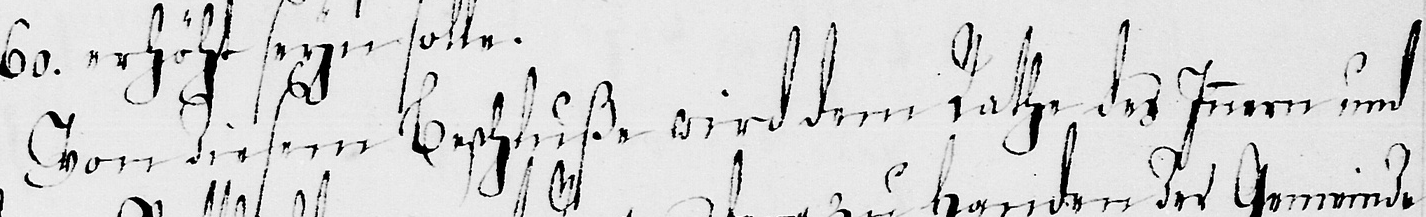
Von diesem Beschluße wird dem Rathe des Innern und
